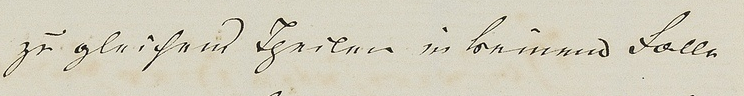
zu gleichen Theilen in keinem Falle
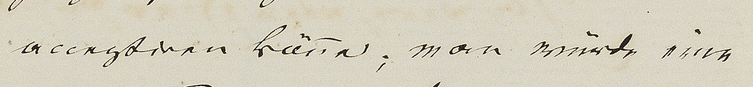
acceptiren könne; man würde eine
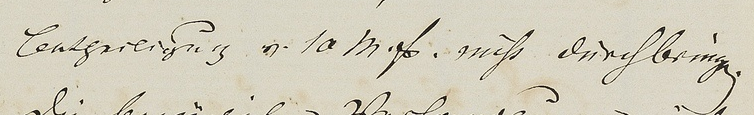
Betheiligung v. 10. M. F. nicht durchbringen.
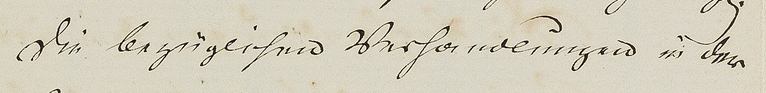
Die bezüglichen Verhandlungen in der
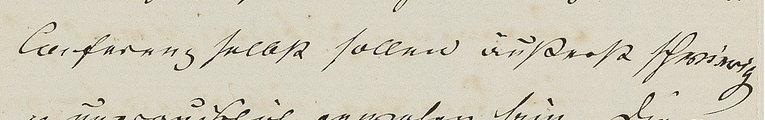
Conferenz selbst sollen äußerst schwierig
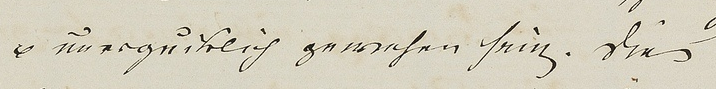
& unerquiklich gewesen sein. Die
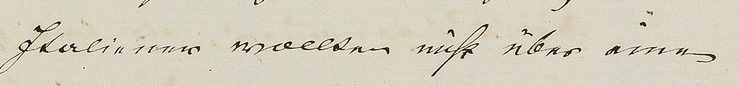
Italiener wollten nicht über eine
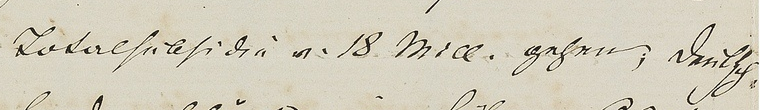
Totalsubsidie v. 18 Mill. gehen; Deutsch-
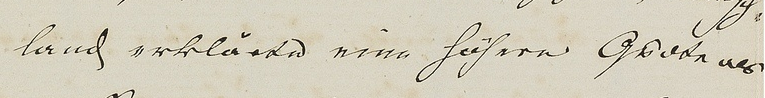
land erklärte eine höhere Quote als
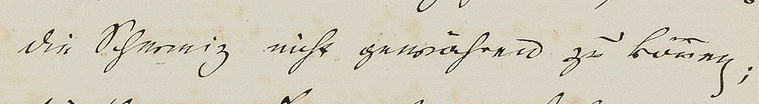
die Schweiz nicht gewähren zu können;
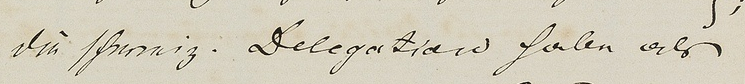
die schweiz. Delegation habe als
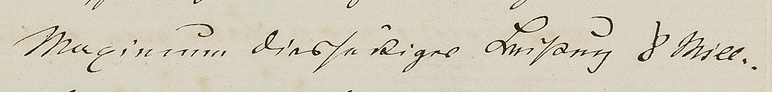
Maximum diesseitiger Leistung 8 Mill.
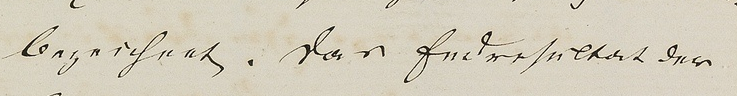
bezeichnet. Das Endresultat der
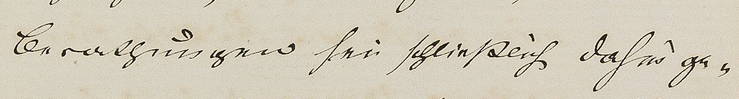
Berathungen sei schließlich dahin ge-
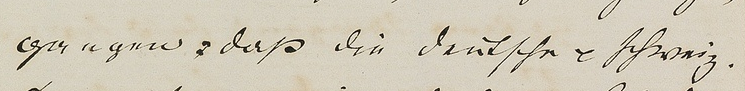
gangen: daß die deutsche & schweiz.
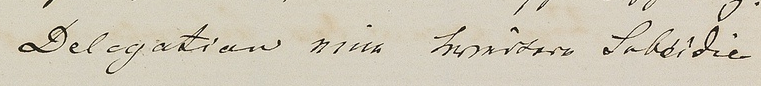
Delegation eine weitere Subsidie
